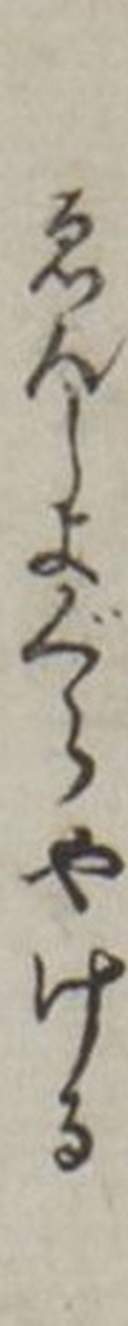ゑんしよぐらやける
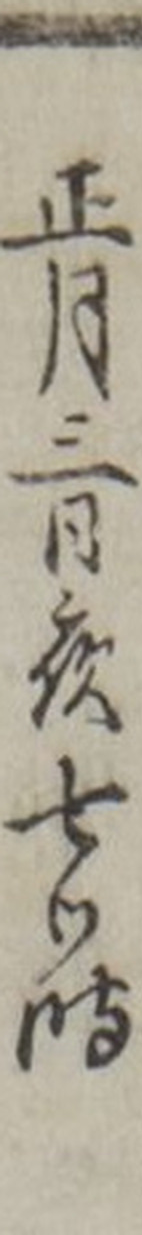正月三日夜七ツ時
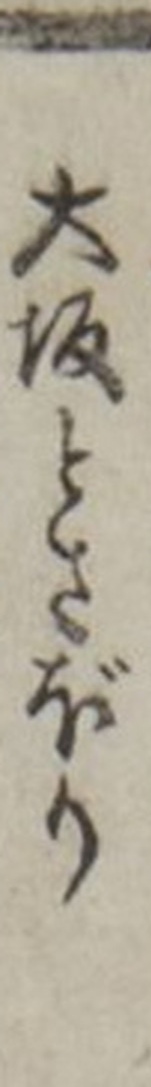大阪とさぼり
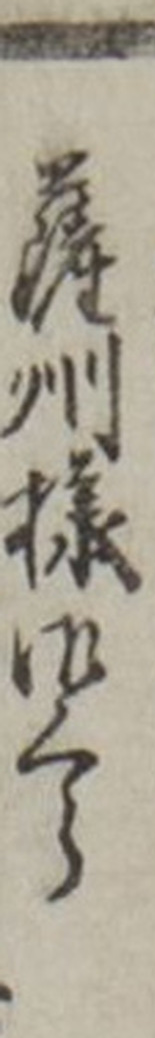薩州様御くら
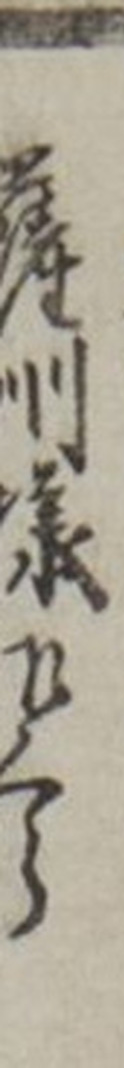薩州様御くら
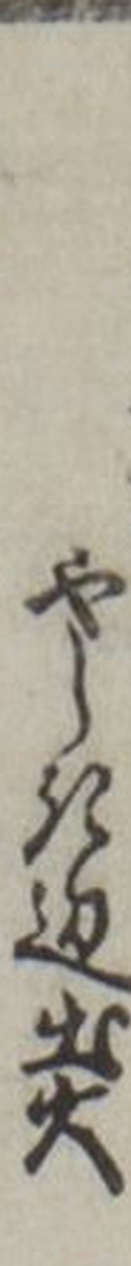やしき辺出火
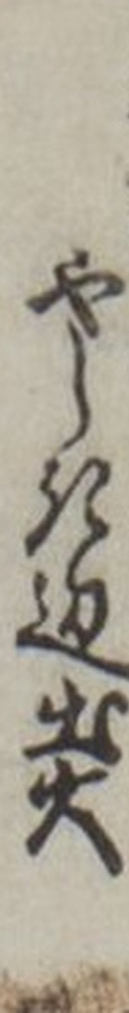やしき辺出火
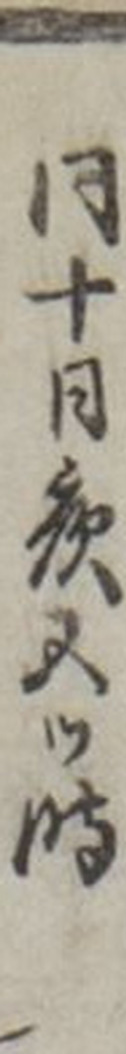同十日夜五ツ時
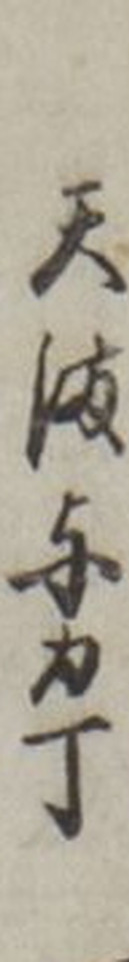天満与力町
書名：大阪・伏見出火の図
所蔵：あいおいニッセイ同和損保株式会社
